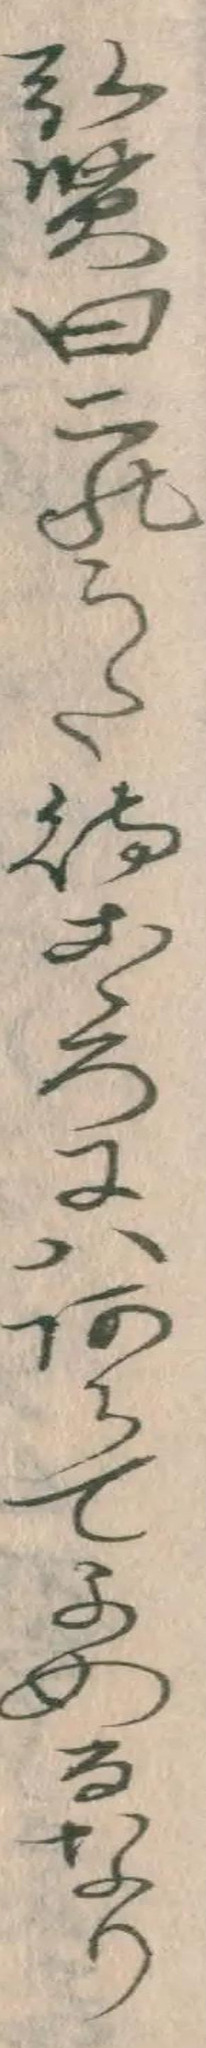弘賢曰このうた待こゝろにはあらてよめるなり
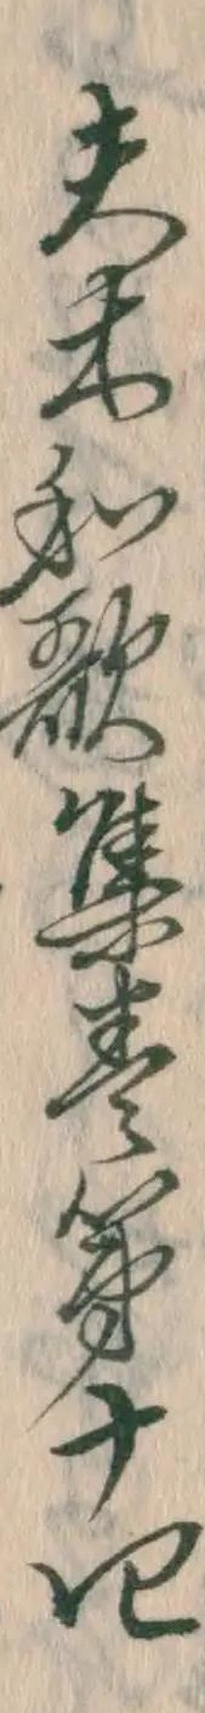夫木和歌集巻第十四
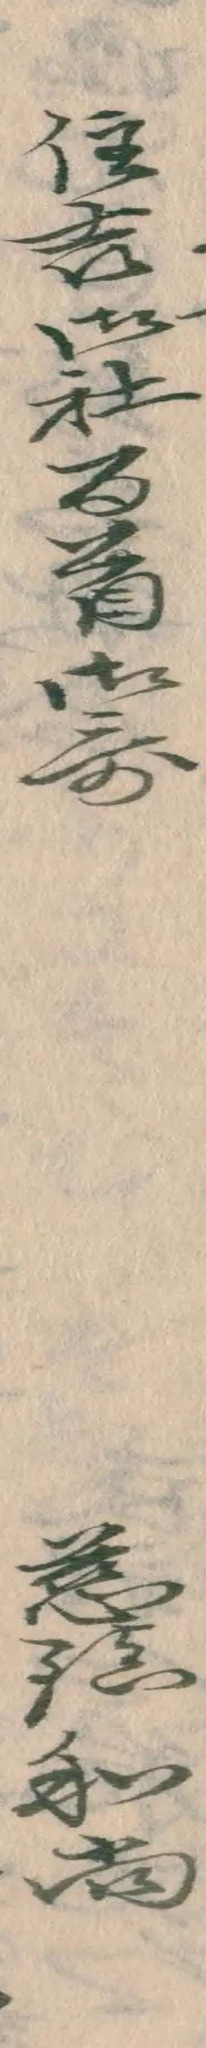住吉御社百首御哥慈鎮和尚
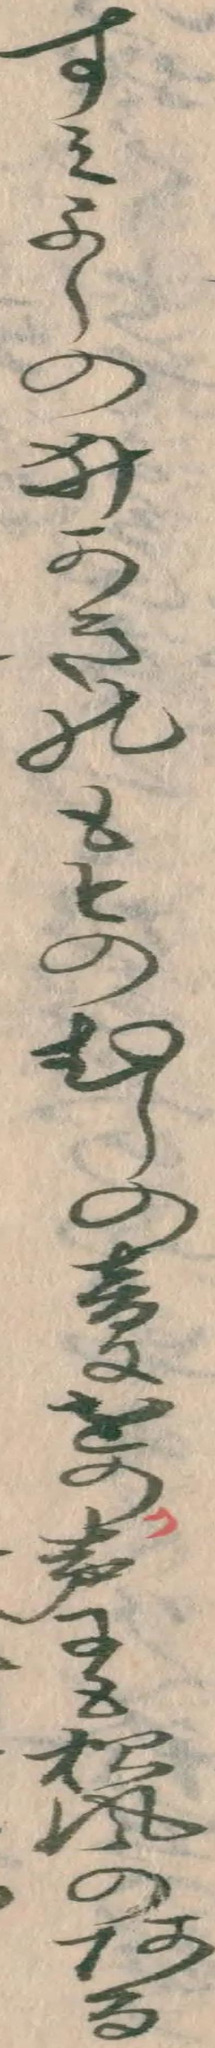すみよしのゐかきのもとのむしの音にをのか声にも松風のある
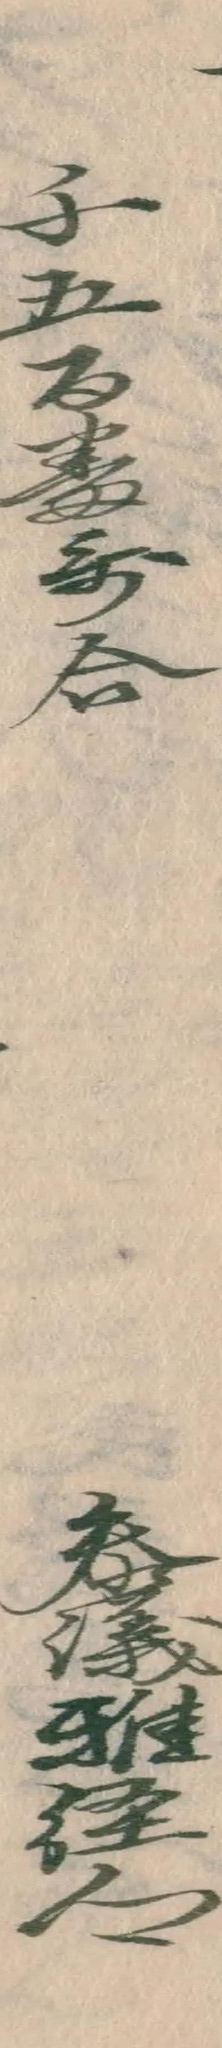千五百番哥合参議雅経卿
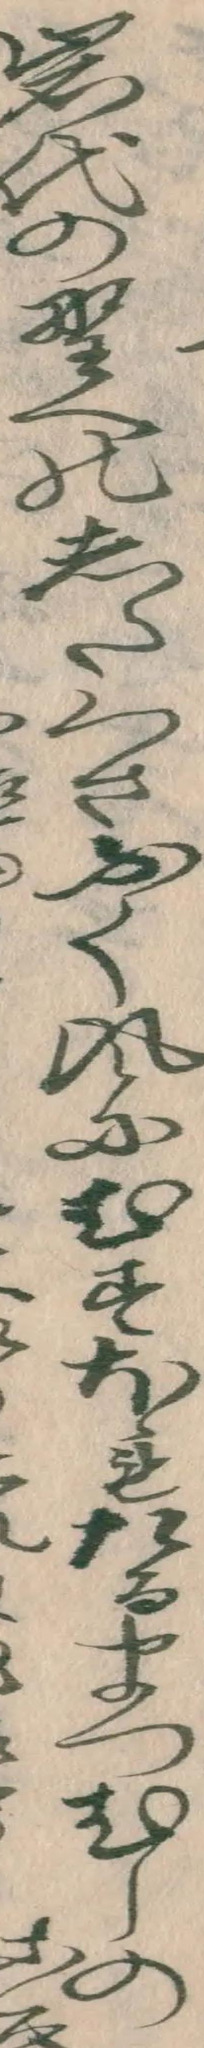岩代の野へのしたくさふく風にむすほゝれたるまつむしの
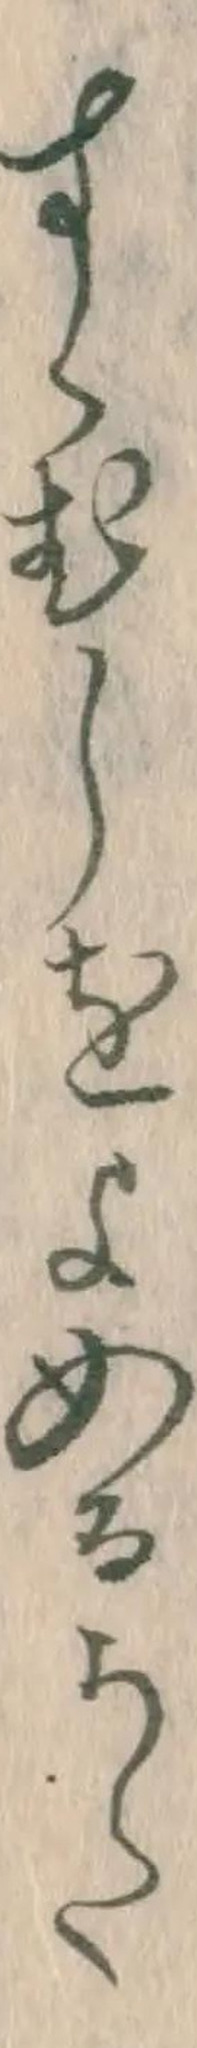すゝむしをよめるうた
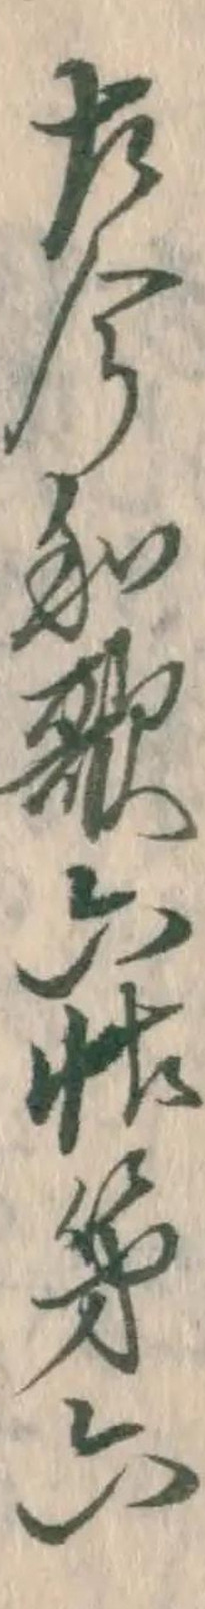古今和歌六帖第六
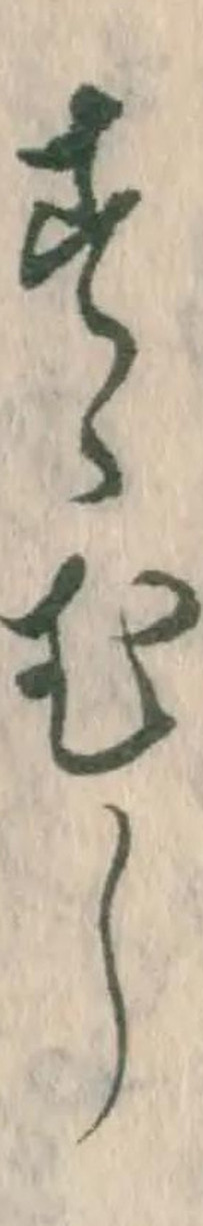すゝむし
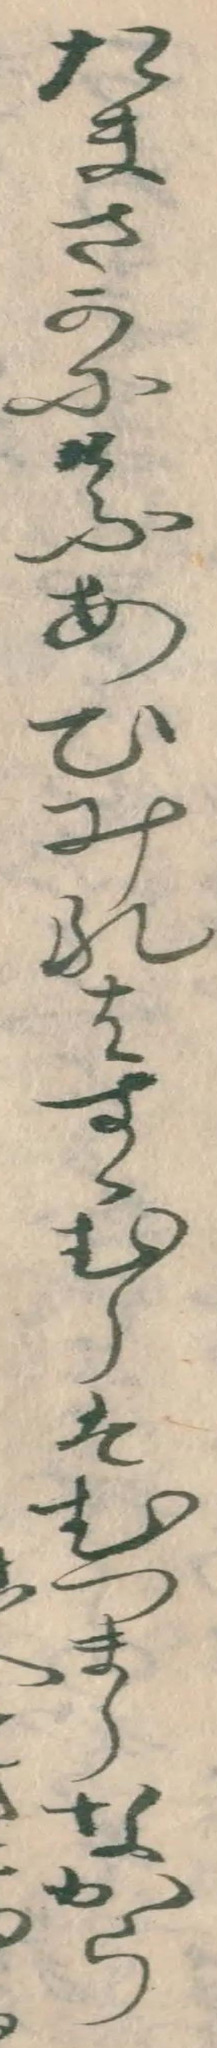たまさかにふあひみれはすゝむしはむつましなから
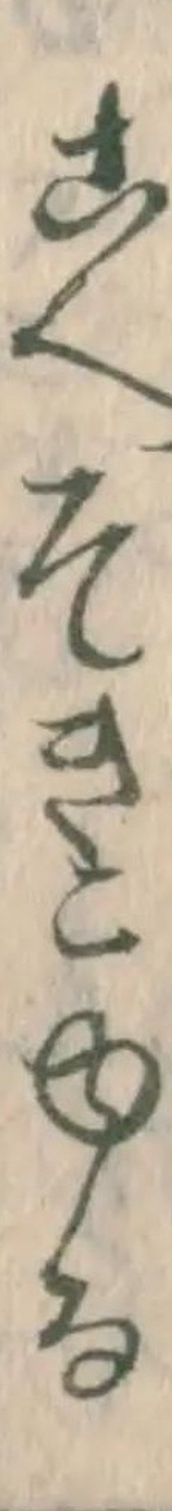こへそきこゆる
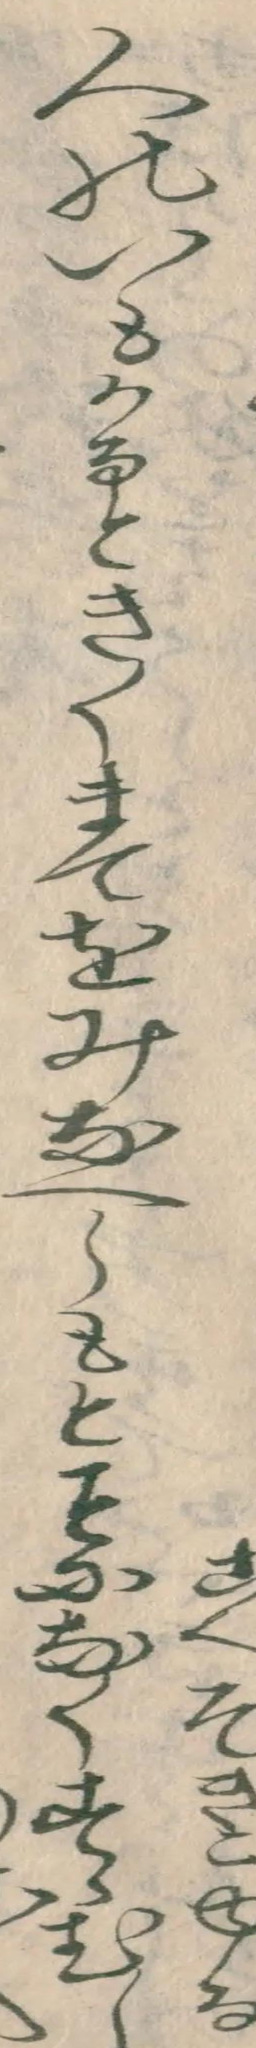人のいもかるときくまてをみなへしもとことになくすゝむし
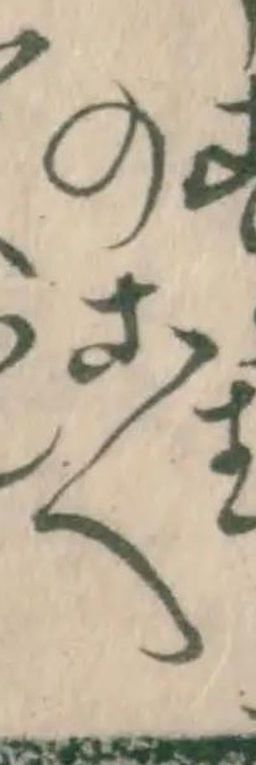のこへ
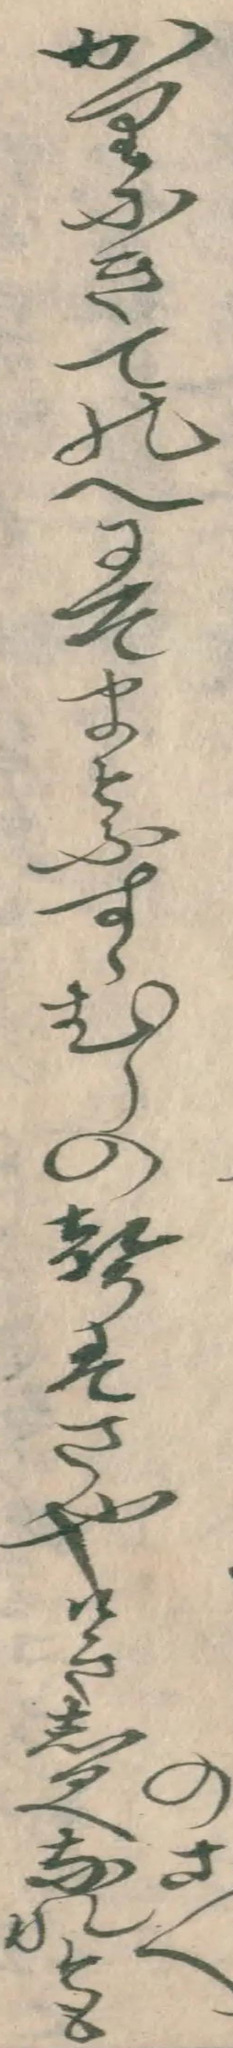かりにきてのへにそまとふすゝむしの聲はさやけきしるへなれとも

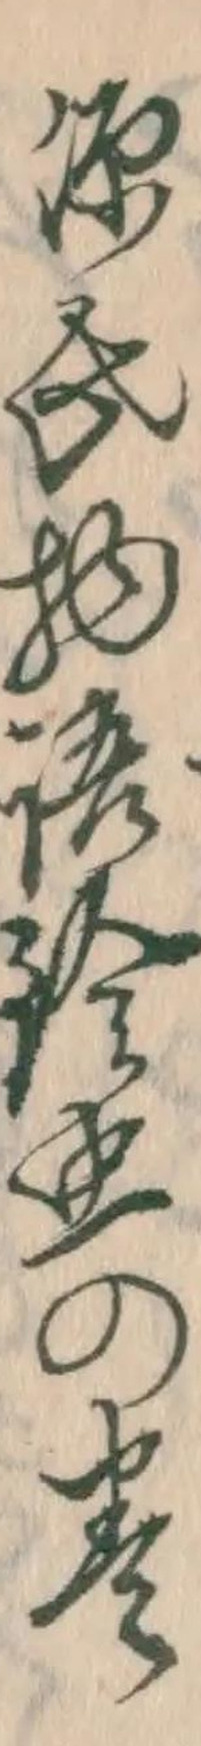源氏物語鈴虫の巻
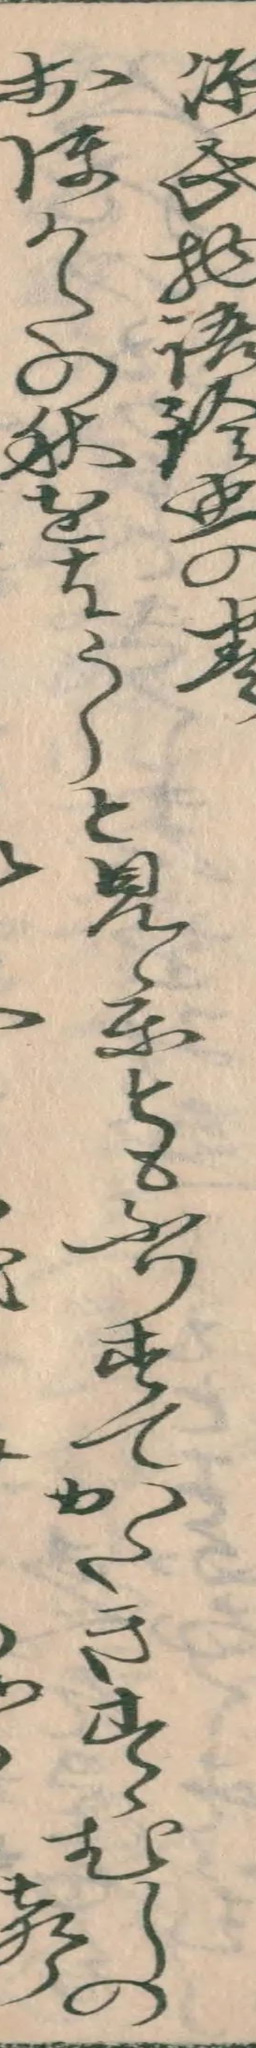おほかたの秋をはうしと見ともふりすてかたきすゝむしの
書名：千蟲譜 3巻. [3]
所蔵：国立国会図書館 National Diet Library, JAPAN
